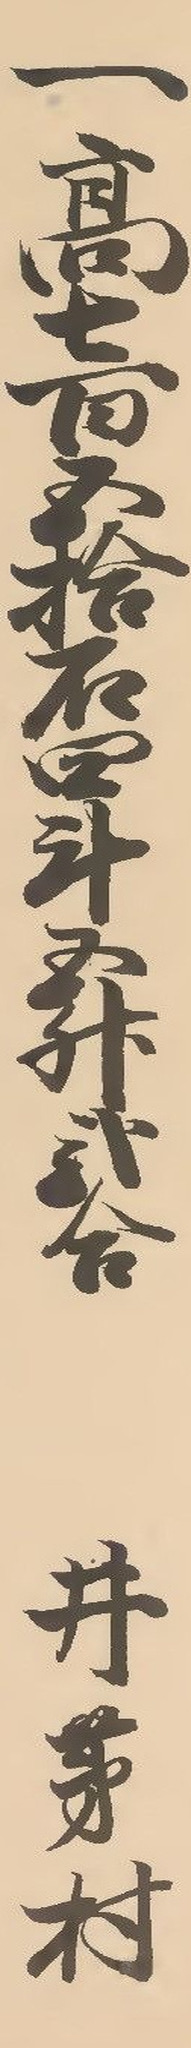一髙七百五拾石四斗五升弐合井村
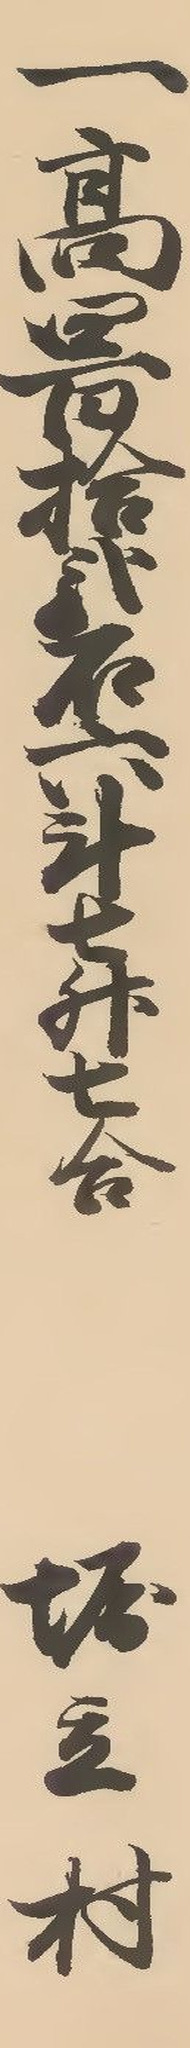一髙四百拾弐石六斗七升七合堀立村
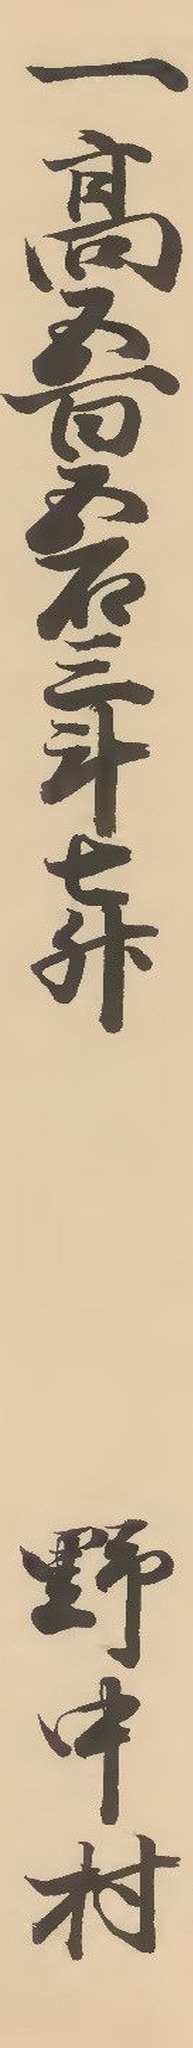一髙五百五石三斗七升野中村
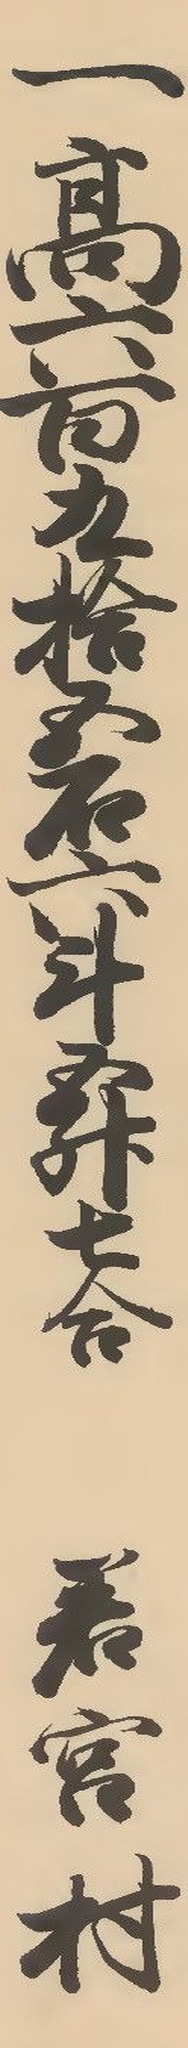一髙六百九拾五石六斗五升七合若宮村

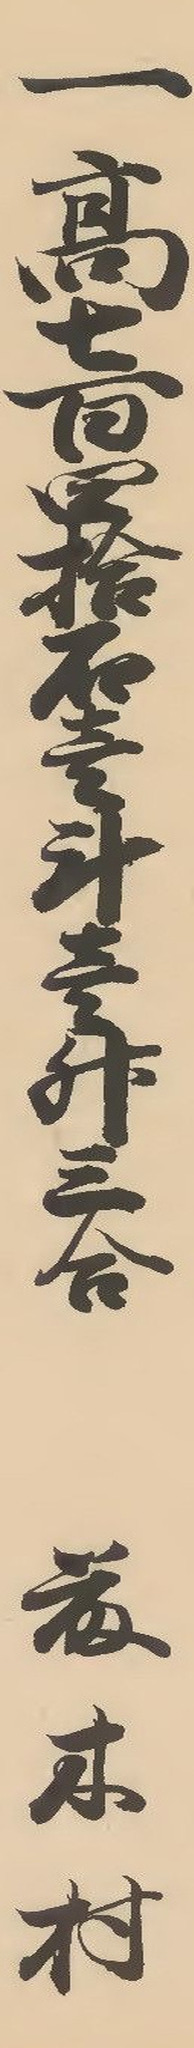一髙七百四拾石壱斗壱升三合藤木村
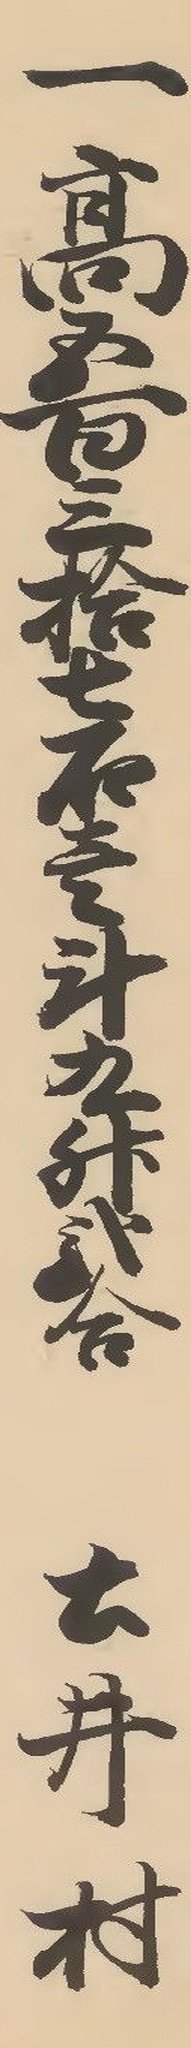一髙五百三拾七石壱斗九升弐合土井村
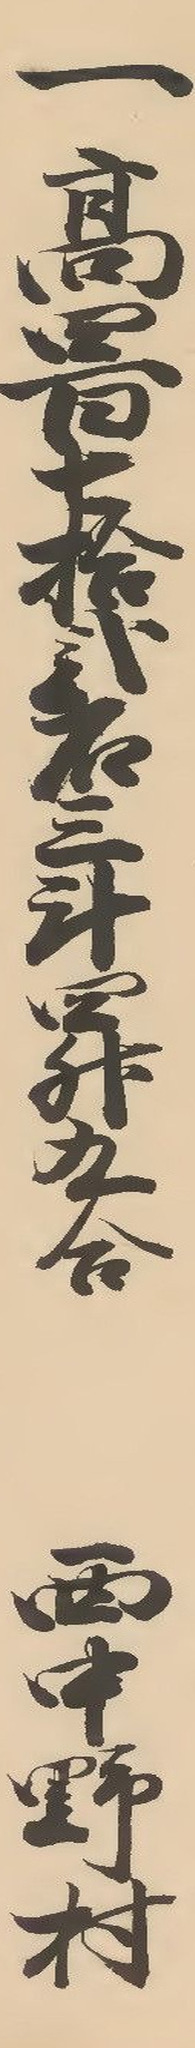一髙四百七拾弐石三斗四升九合西中野村
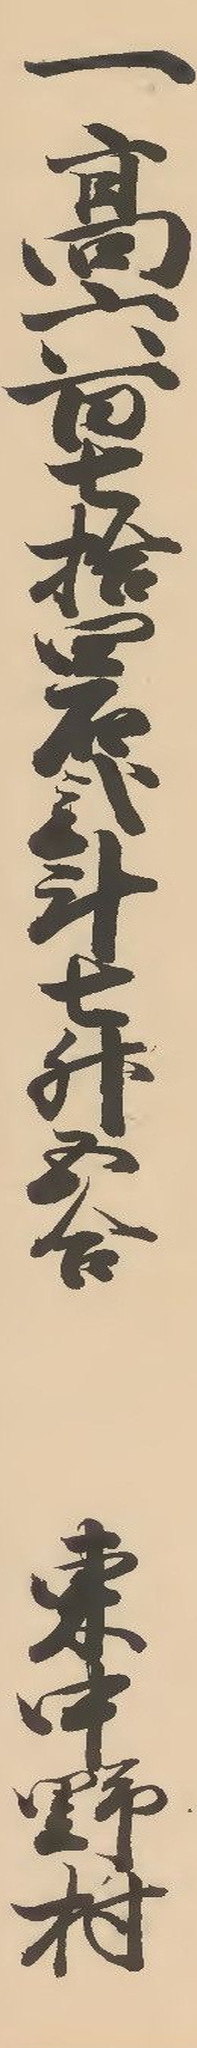一髙六百七拾四石弐斗七升五合東中野村
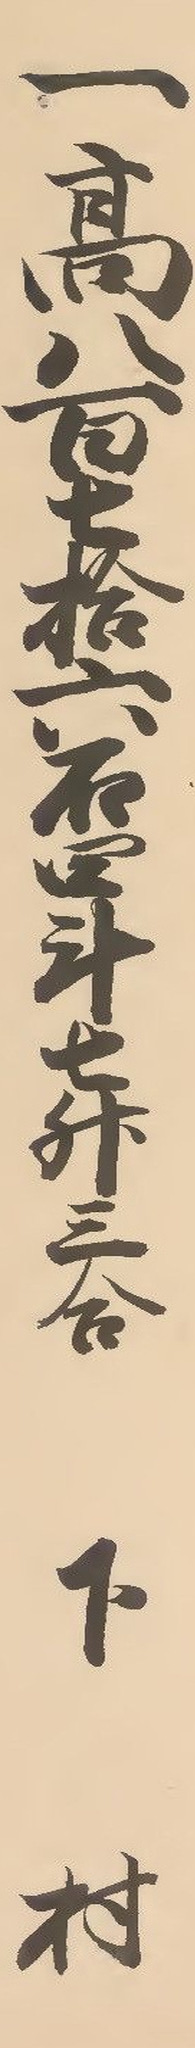一髙八百七拾六石四斗七升三合下村
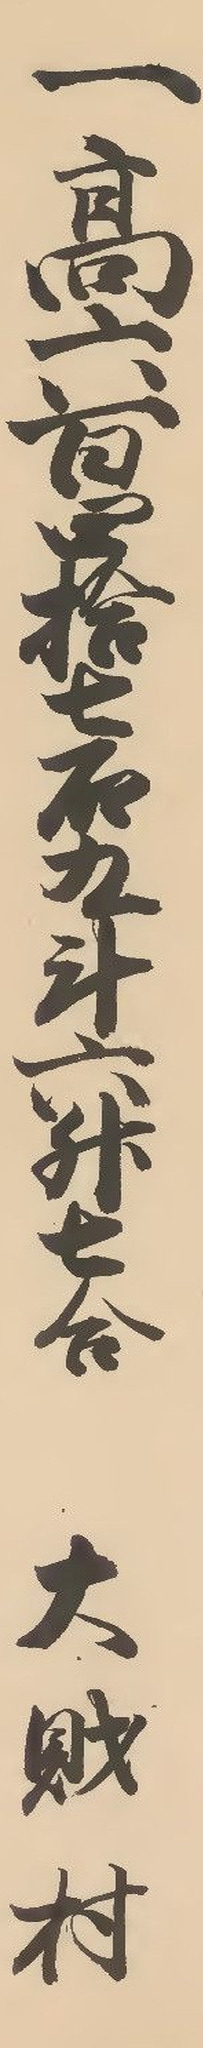一髙六百四拾七石九斗六升七合大財村
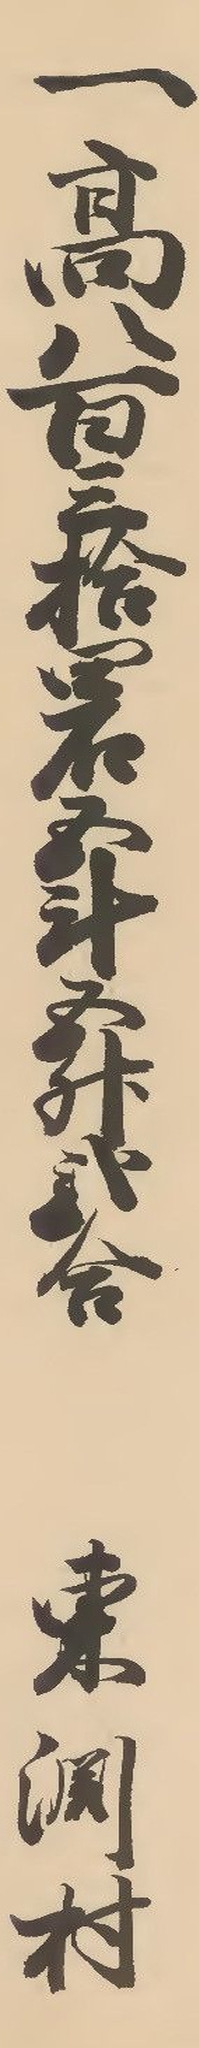一髙八百三拾四石五斗五升弐合東淵村
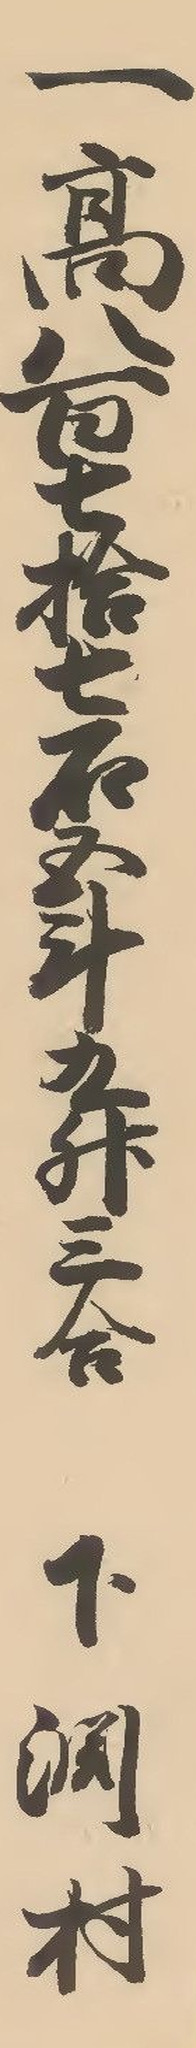一髙八百七拾七石五斗九升三合下淵村

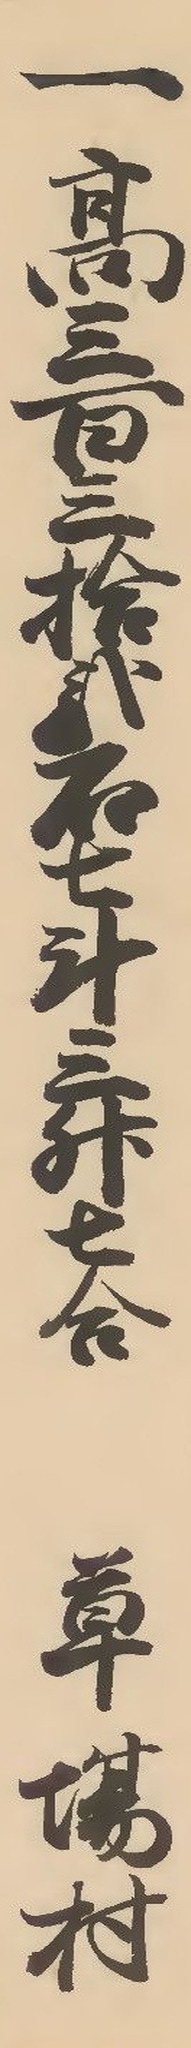一髙三百三拾弐石七斗三升七合草場村
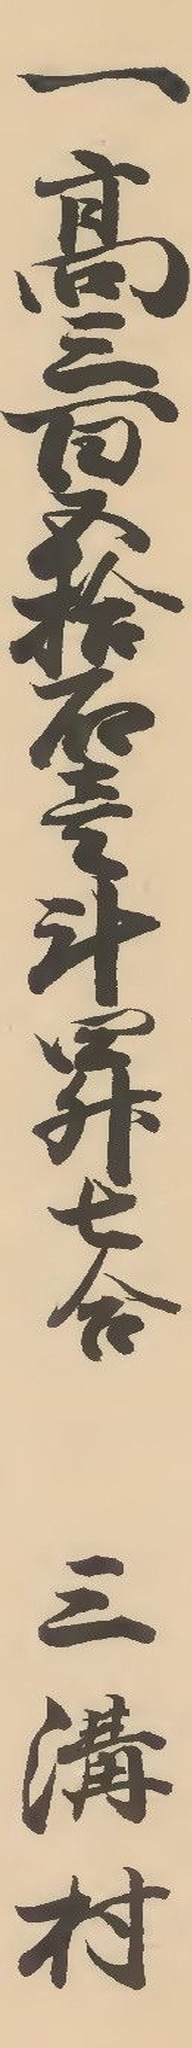一髙三百五拾石壱斗四升七合三溝村
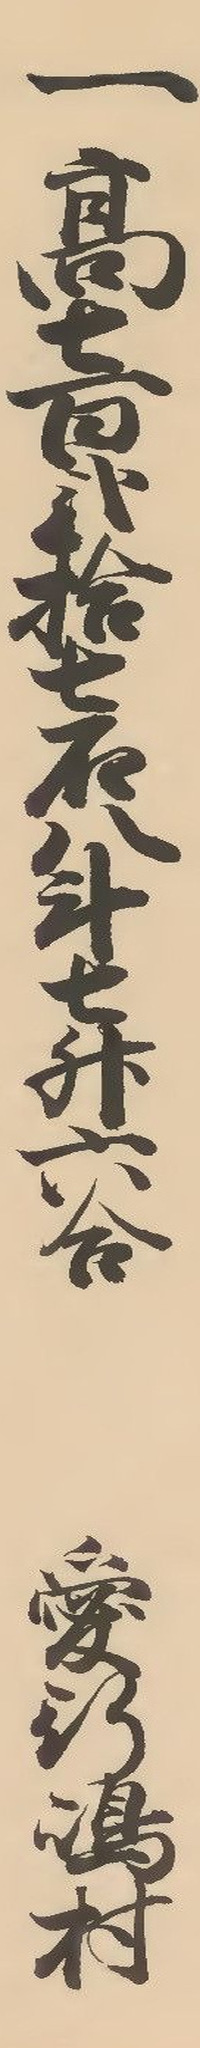一髙七百弐拾七石八斗七升六合愛行嶋村
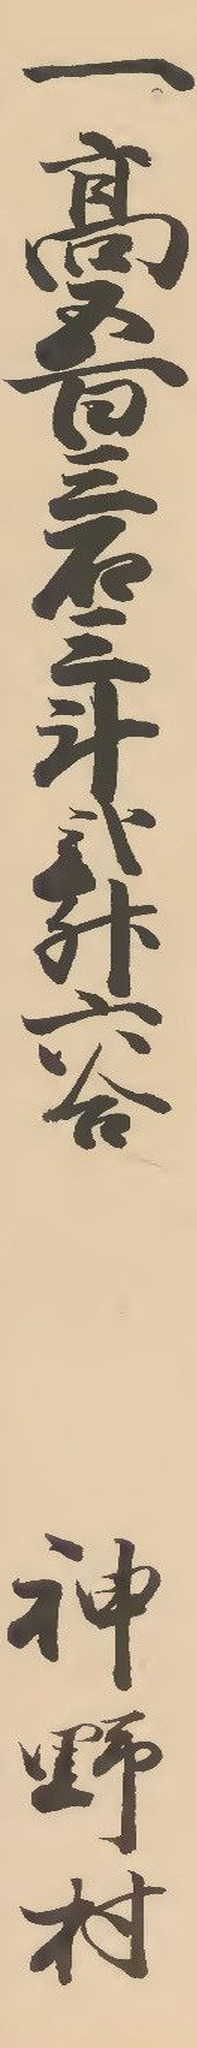一髙五百三石三斗弐升六合神野村
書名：肥前国郷帳
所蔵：国立公文書館 National Archives of Japan
